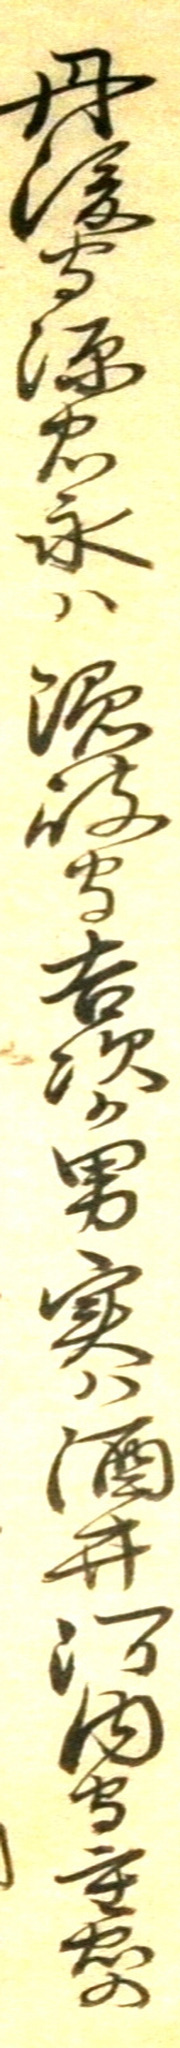丹後守源忠永は隠岐守吉次か男実は酒井河内守重忠の

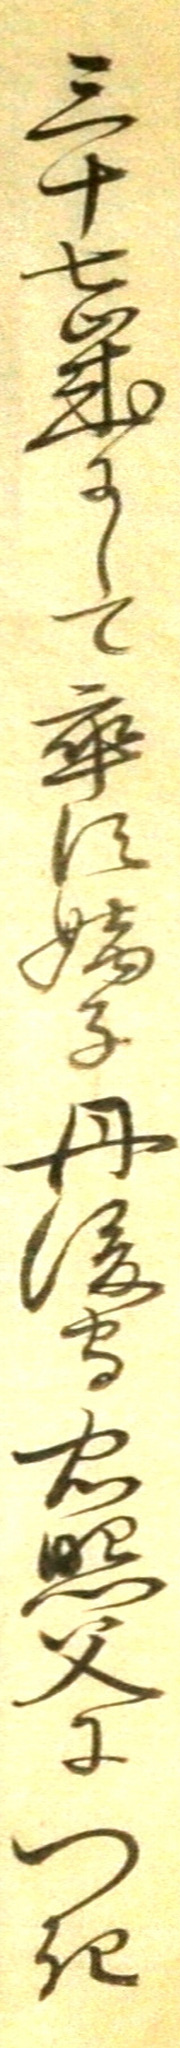三十七歳にして卒す嫡子丹後守忠照父につき
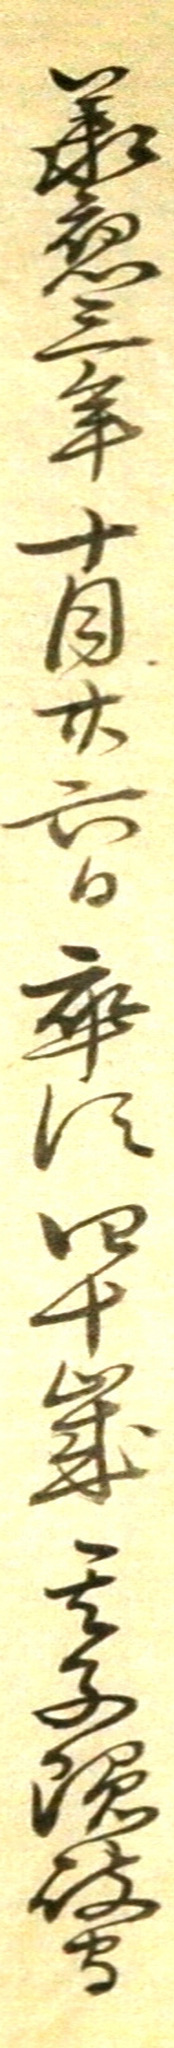承応三年十月廿六日卒す四十歳其子隠岐守
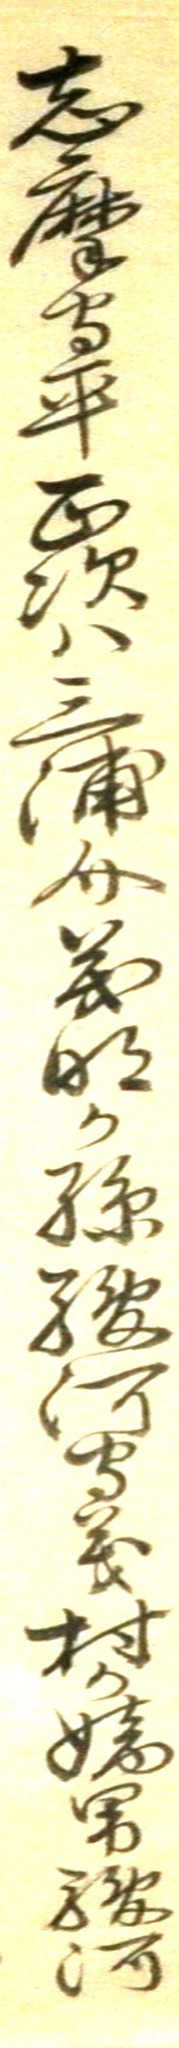志摩守平正次は三浦介義明か孫駿河守義村か嫡男駿河
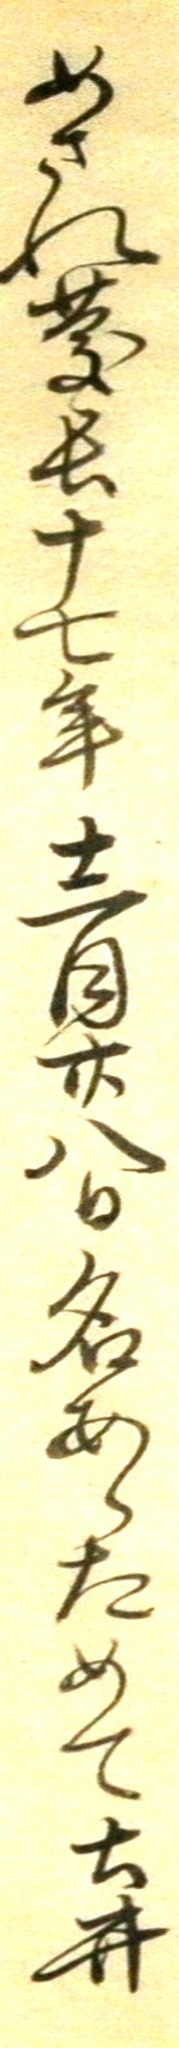めされ慶長十七年十二月廿八日名あらためて土井
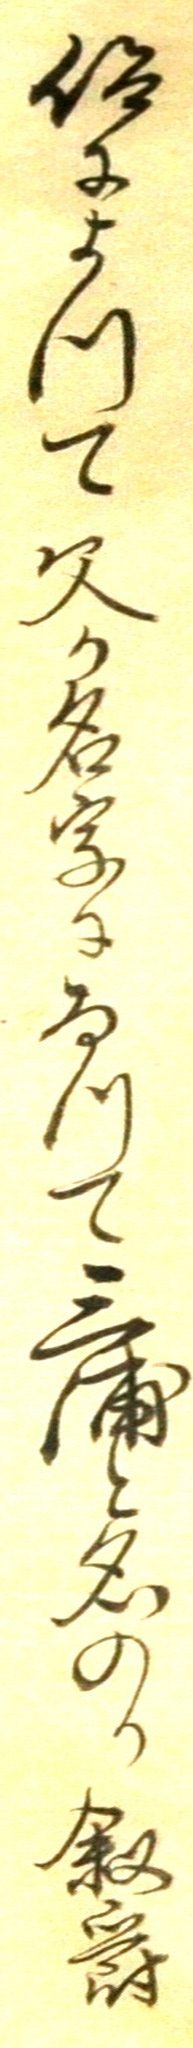仰によつて父か名字になつて三浦と名のり叙爵

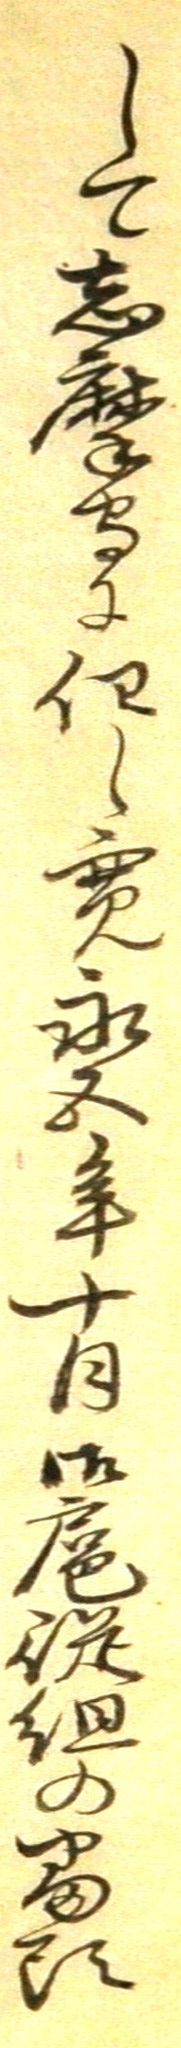して志摩守に任し寛永五年十月御扈従組の番頭
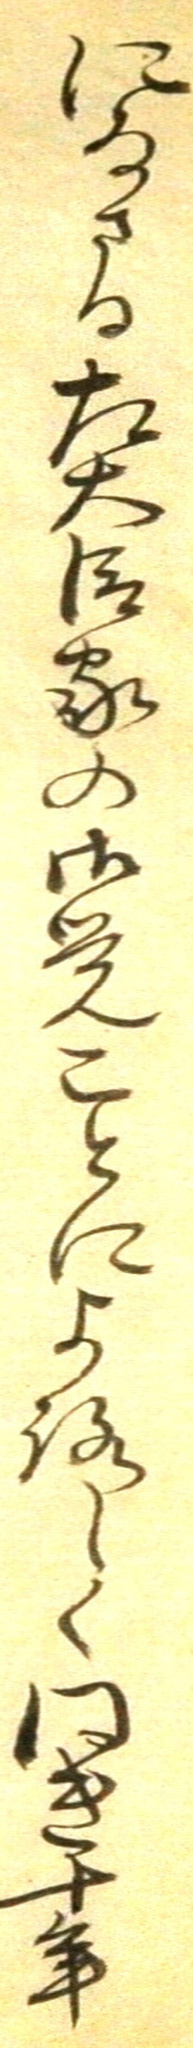になさる左大臣家の御覚ことによろしく同き十年
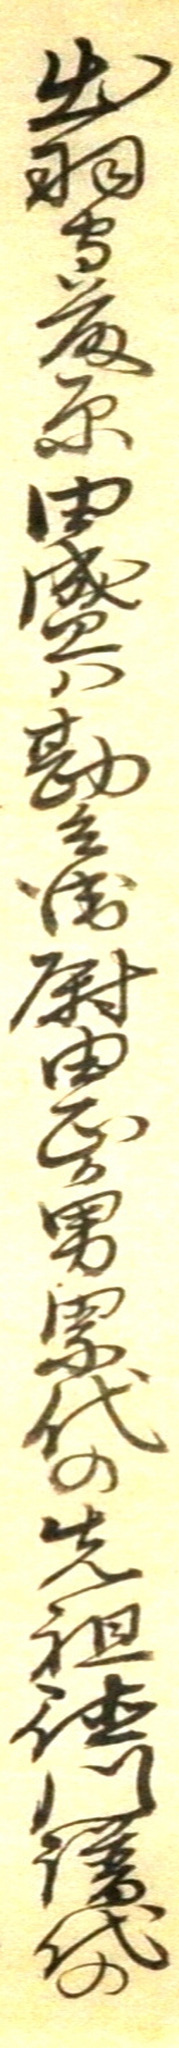出羽守藤原由盛は勘兵衛尉由正か男累代の先祖徳川譜代の
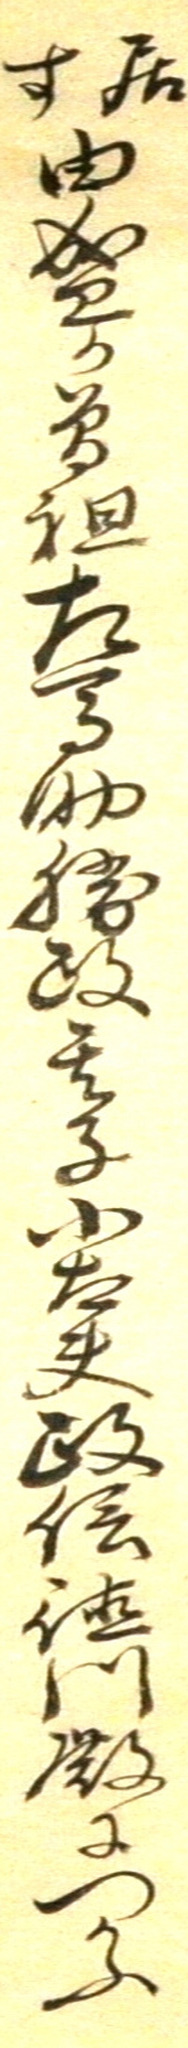居す由盛か曾祖左馬助勝政其子小太夫政信徳川殿につかふ
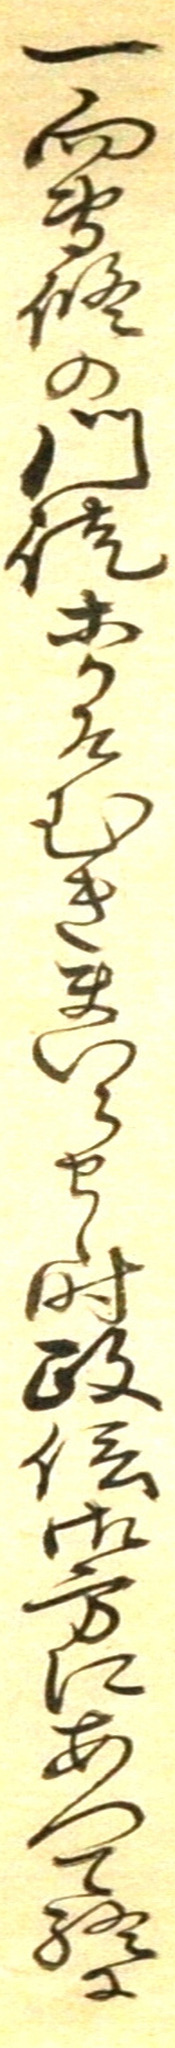一向専修の門徒等かそむそむきまいらせし時政信御方にあつて終に

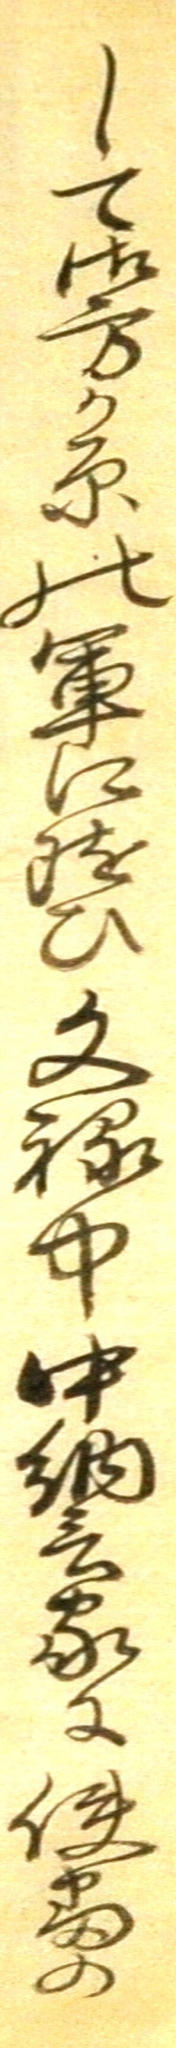して御方か原の軍に随ひ文禄中中納言家に使番の
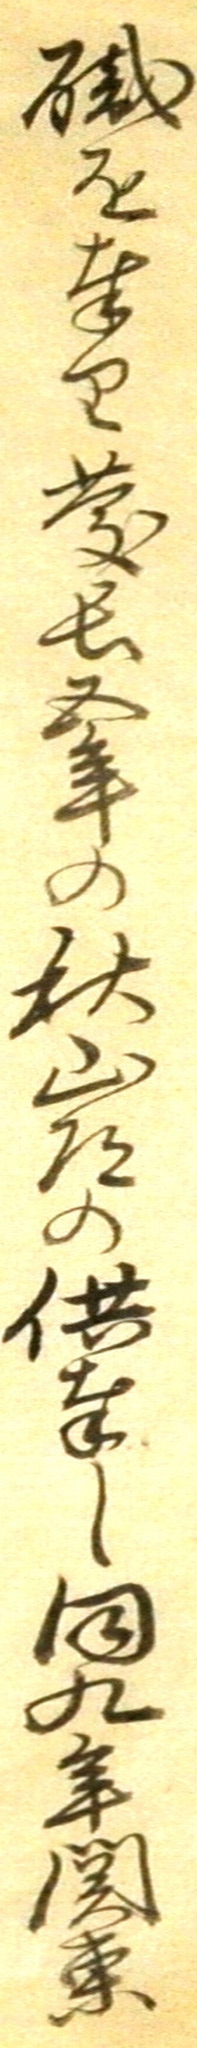職を奉り慶長五年の秋山道の供奉し同九年関東
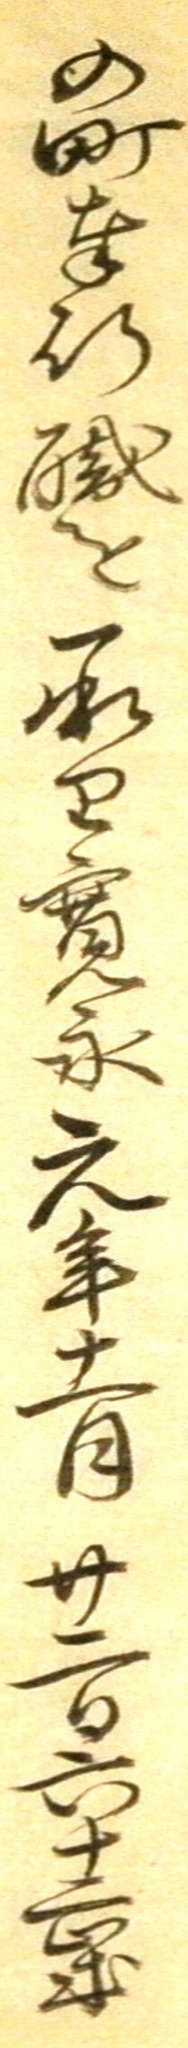の町奉行職を承り寛永元年十一月廿二日六十二歳
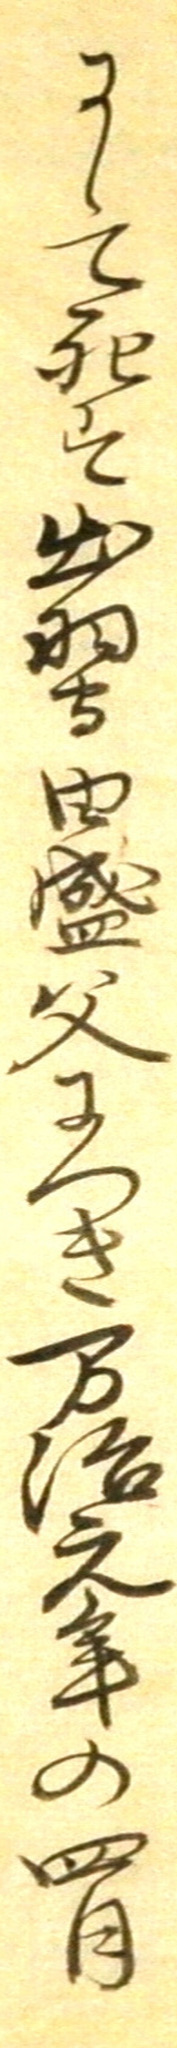にして死す出羽守由盛父につき万治元年の四月
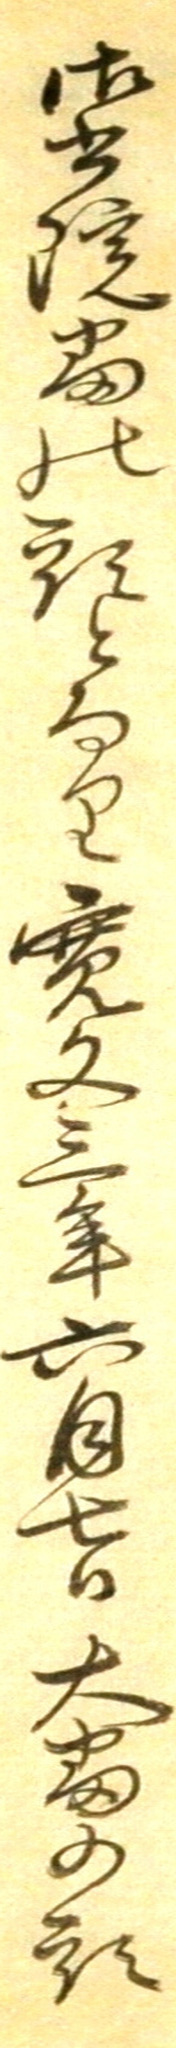御書院番の頭となり寛文三年六月七日大番の頭
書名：藩翰譜（五）
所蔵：伊那市立高遠町図書館・合同会社AMANE
